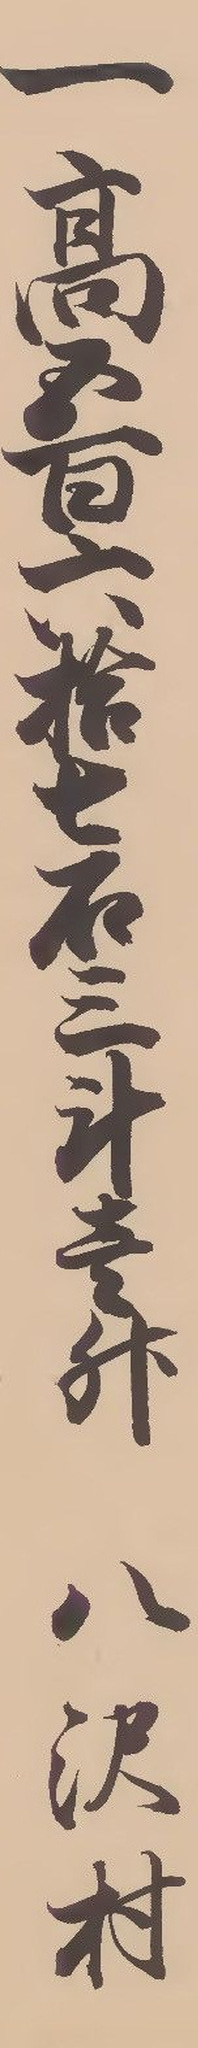一高五百六拾七石三斗壱升八沢村

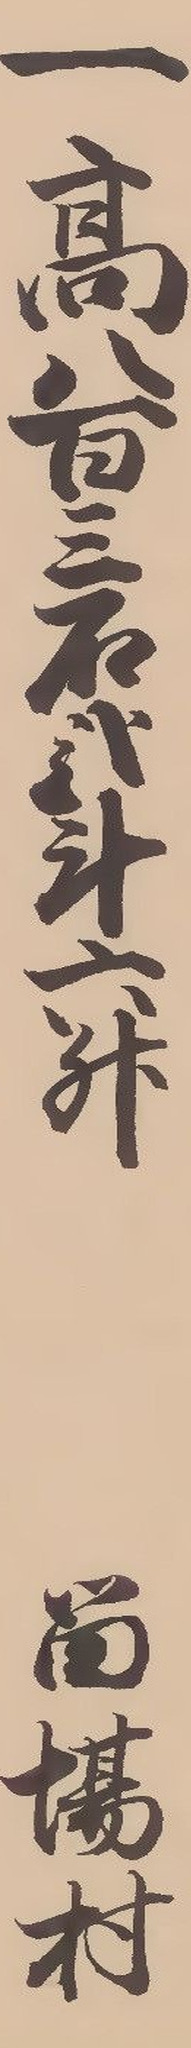一高八百三石弐斗六升留場村
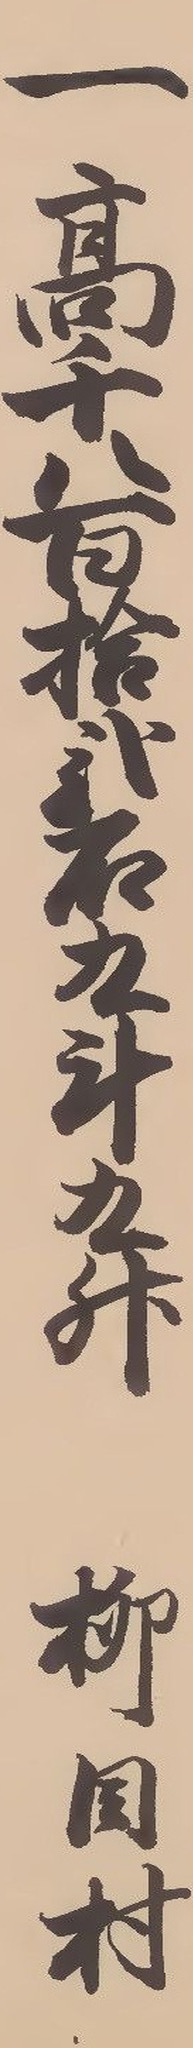一高千八百拾弐石九斗九升柳目村
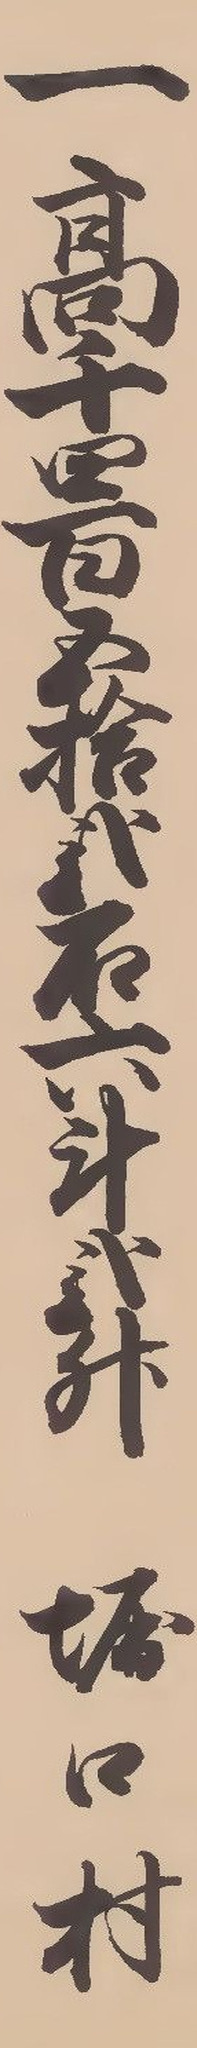一高千四百五拾弐石六斗弐升堀口村
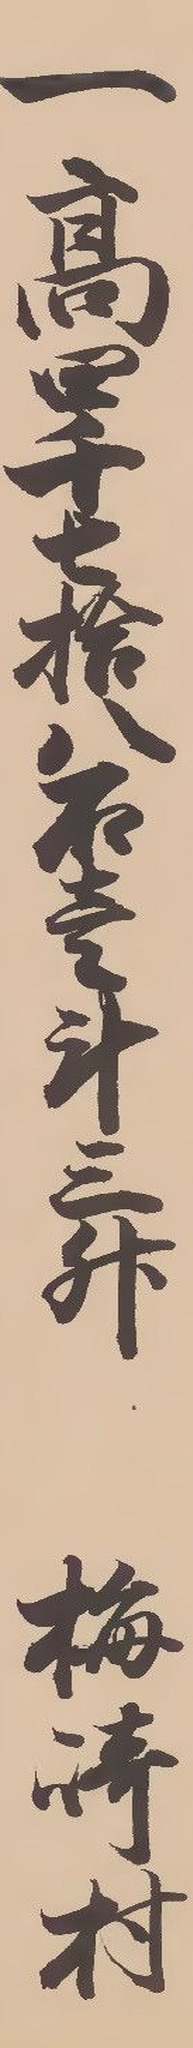一高四千七拾八石壱斗三升梅崎村
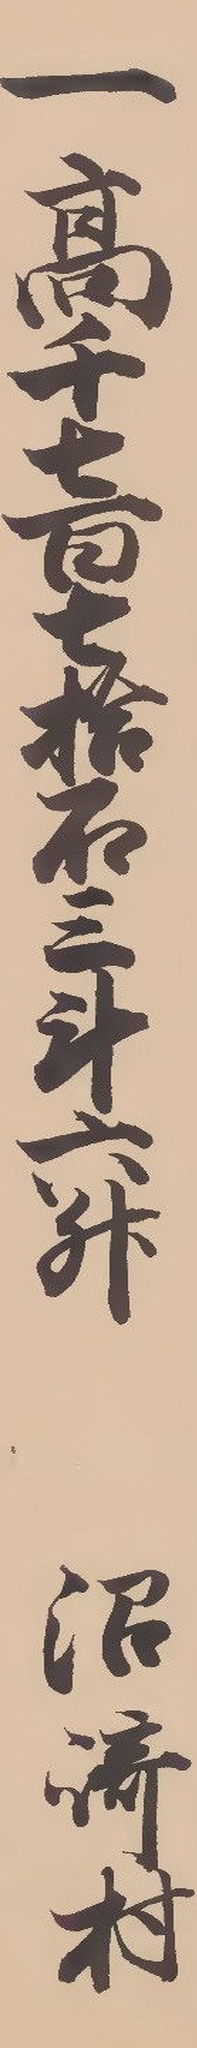一高千七百七拾石三斗六升沼崎村
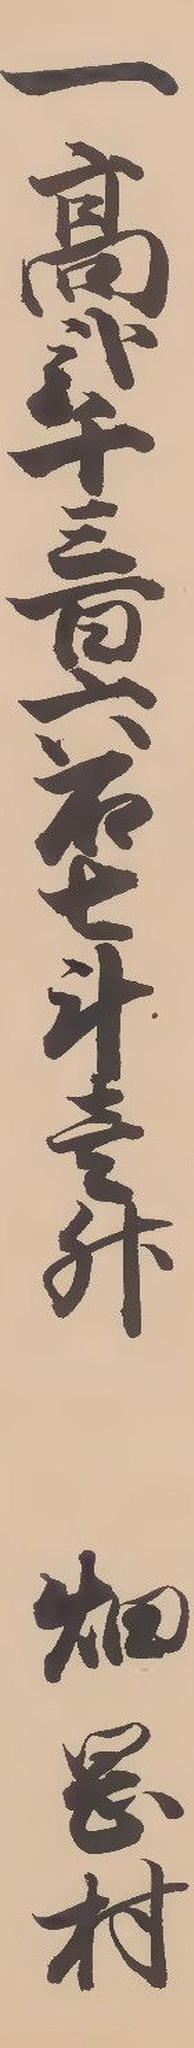一高弐千三百六石七斗壱升畑岡村
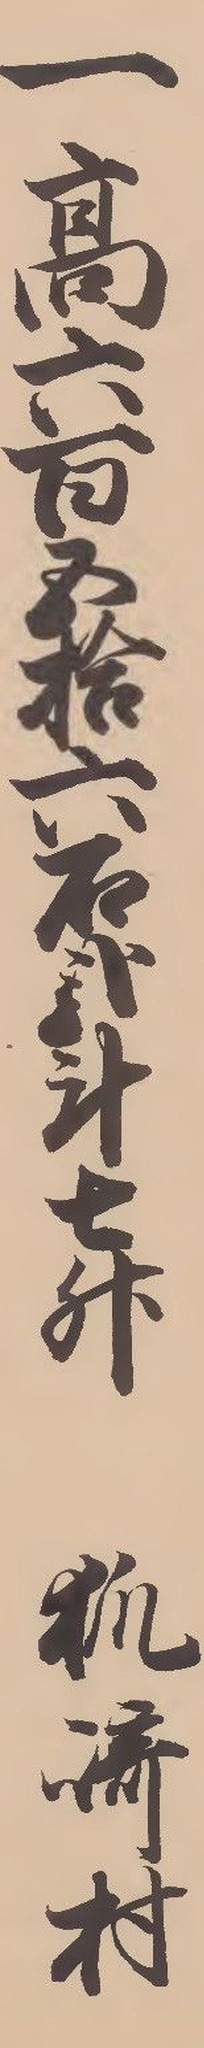一高六百五拾六石弐斗七升狐崎村
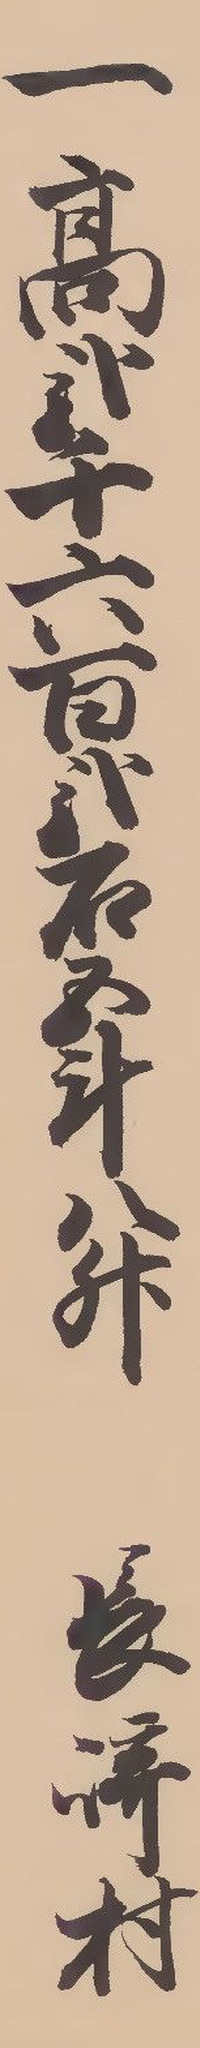一高弐千六百弐石五斗八升長崎村

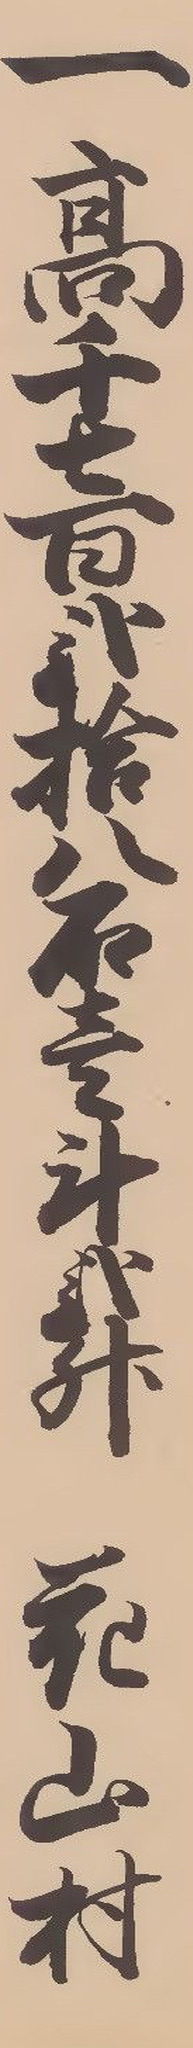一高千七百弐拾八石壱斗弐升花山村
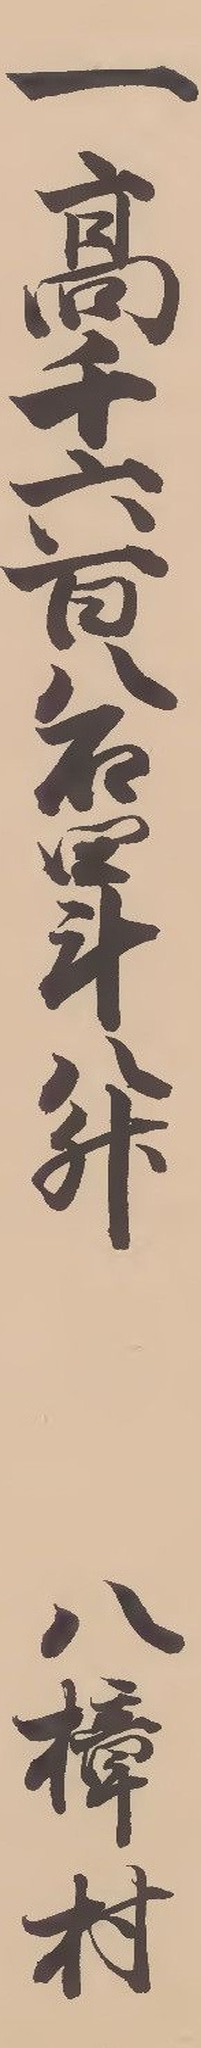一高千六百八石四斗八升八樟村
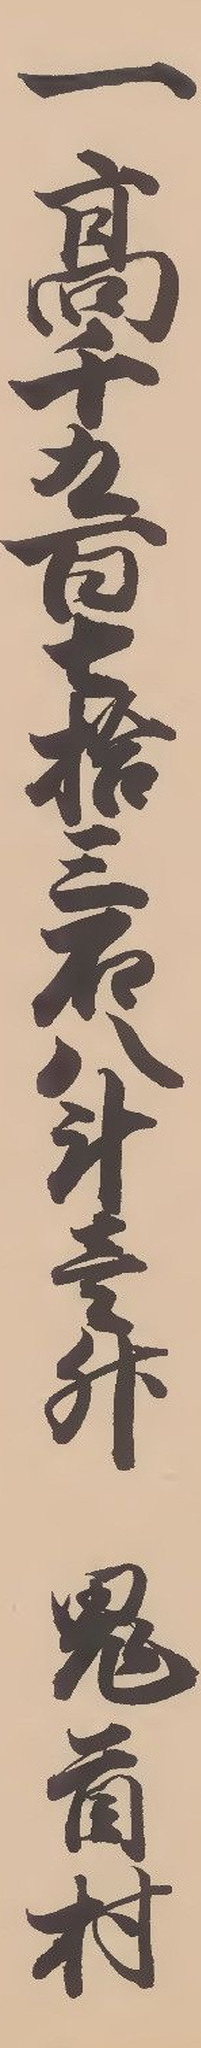一高千九百七拾三石八斗壱升鬼首村
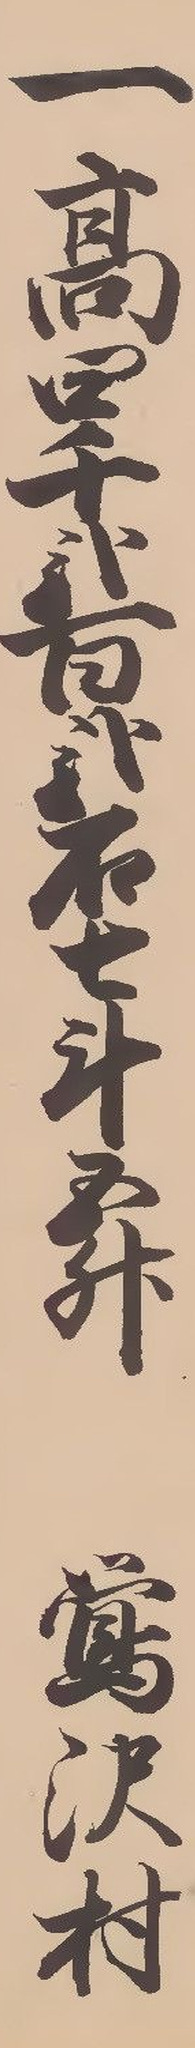一高四千弐百弐石七斗五升鴬沢村
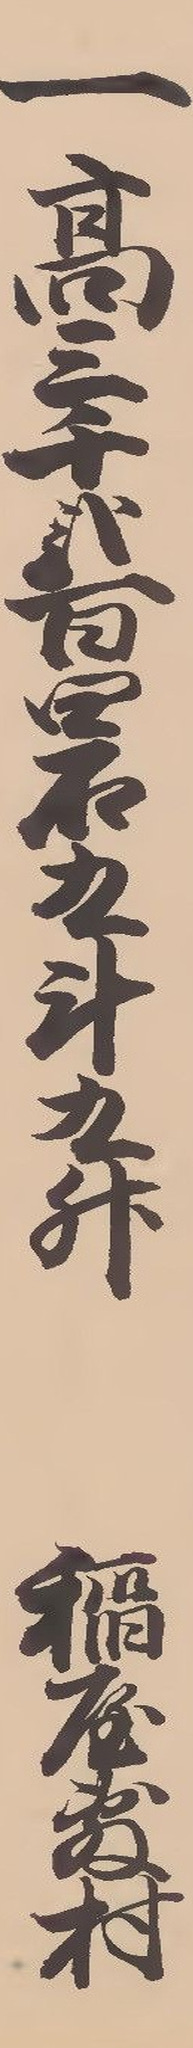一高三千弐百四石九斗九升稲屋敷村
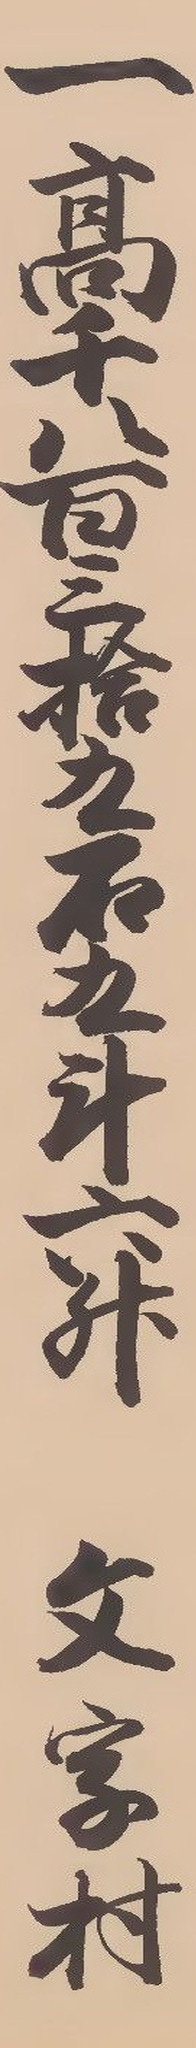一高千八百三拾九石九斗六升文字村
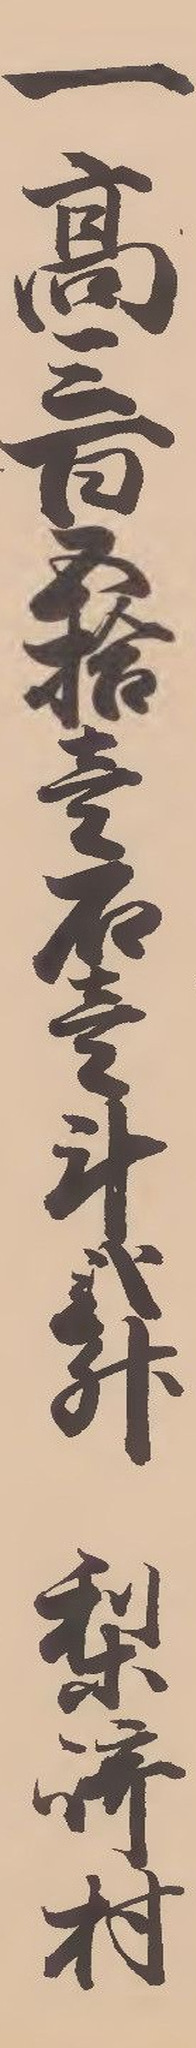一高三百五拾壱石壱斗弐升梨崎村
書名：陸奥国郷帳　５
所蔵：国立公文書館 National Archives of Japan
